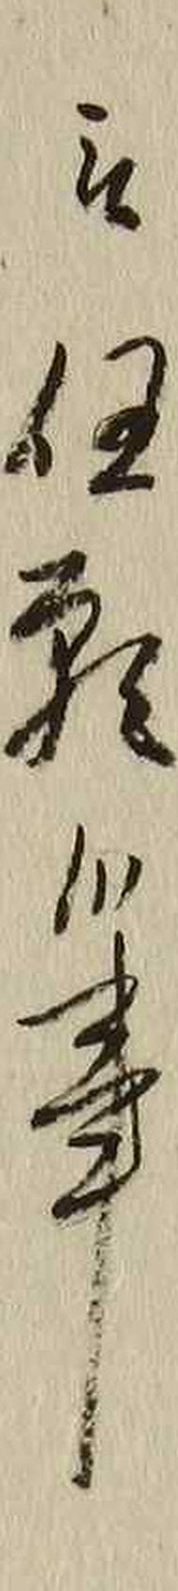被任願候事
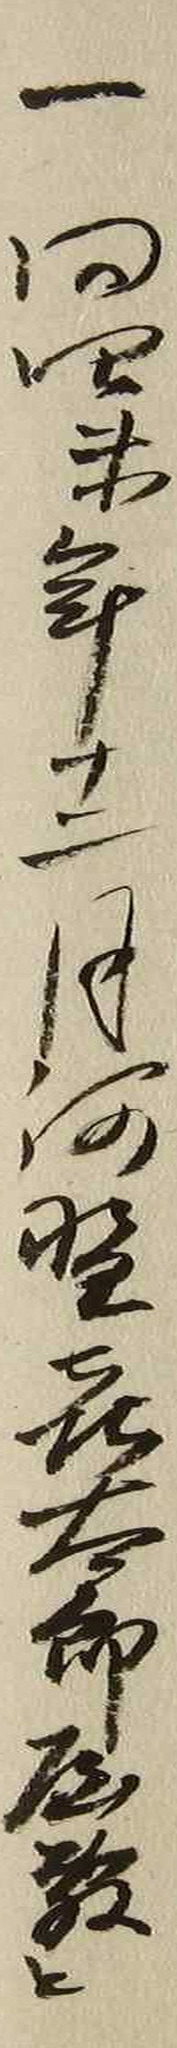一同四未年十二月河野喜太郎屋敷と
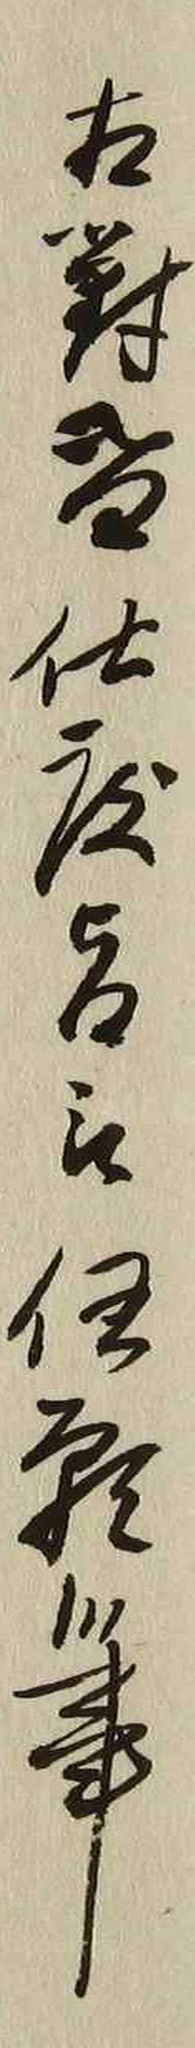相対替仕度旨被任願候事
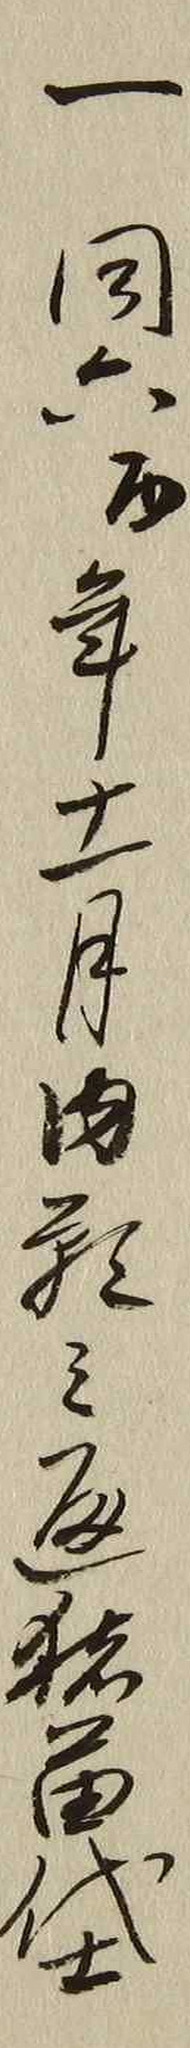一同六酉年十一月内願之通猪苗代士
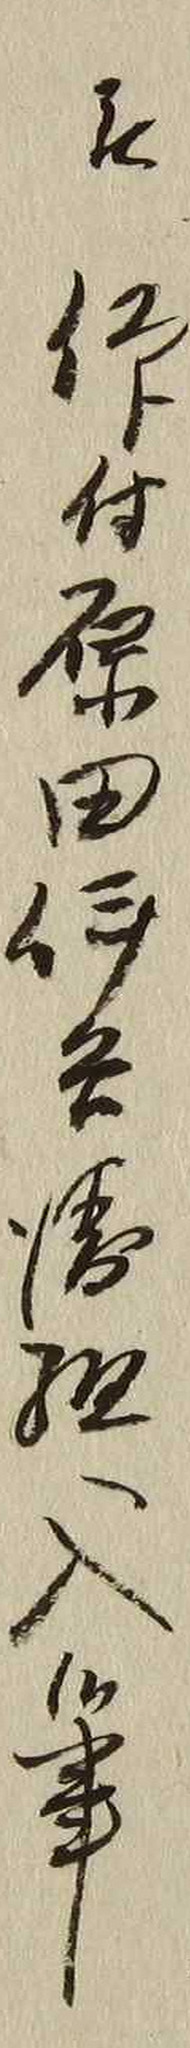被仰付原田伊兵清組へ入候事
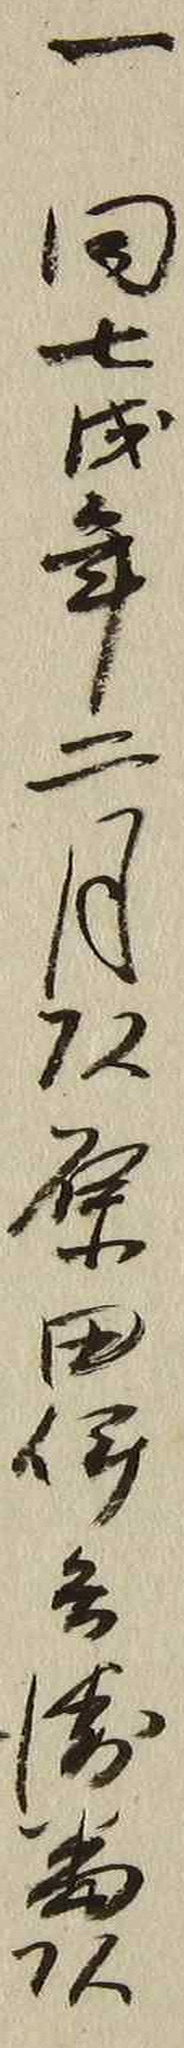一同七戌年二月頭原田伊兵衛番頭
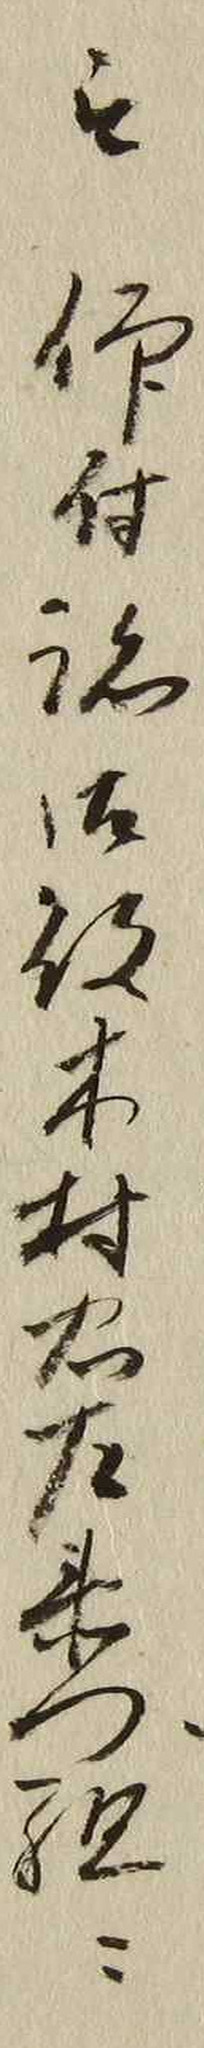被仰付跡御役木村忠左衛門組ニ
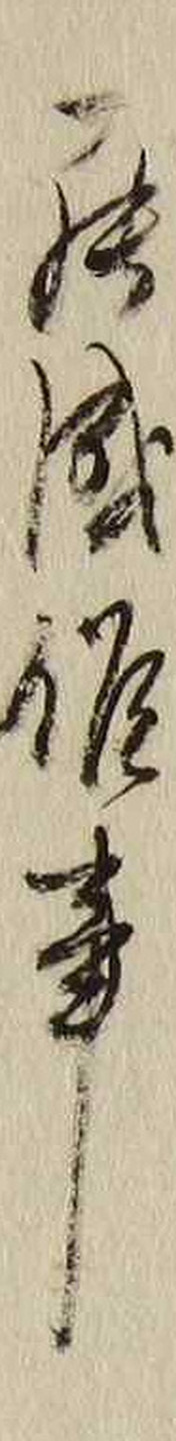罷成候事
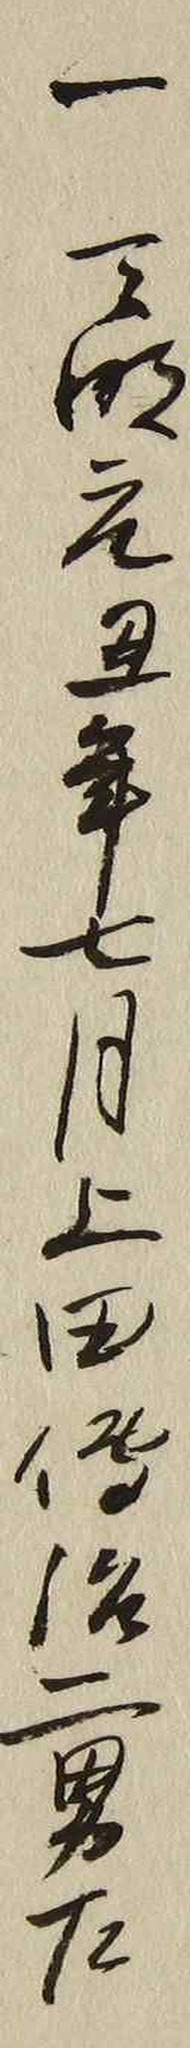一天明元丑年七月上田伝治二男左
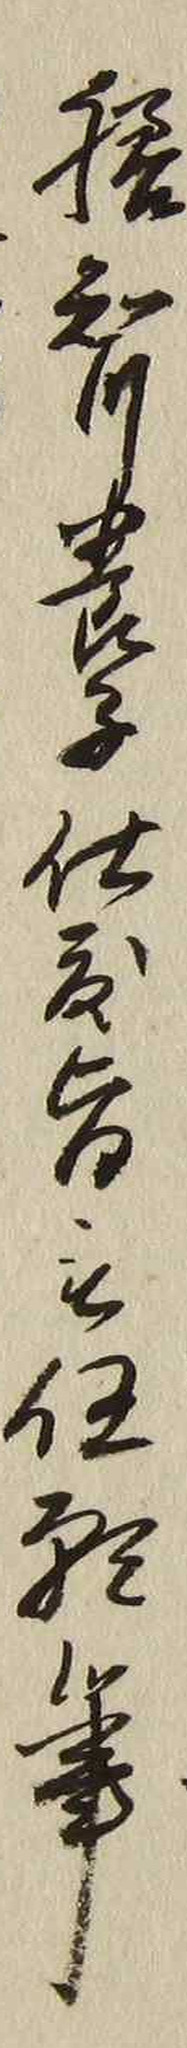膳婿養子仕度旨被任願候事
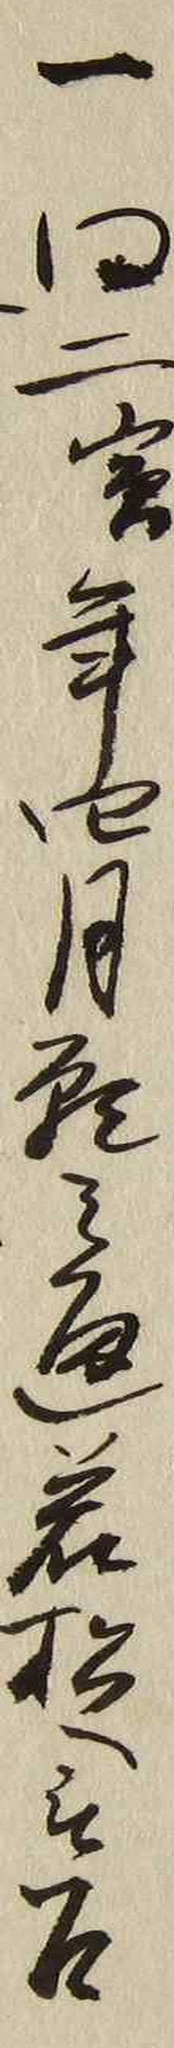一同二寅年四月願之通若松へ被召
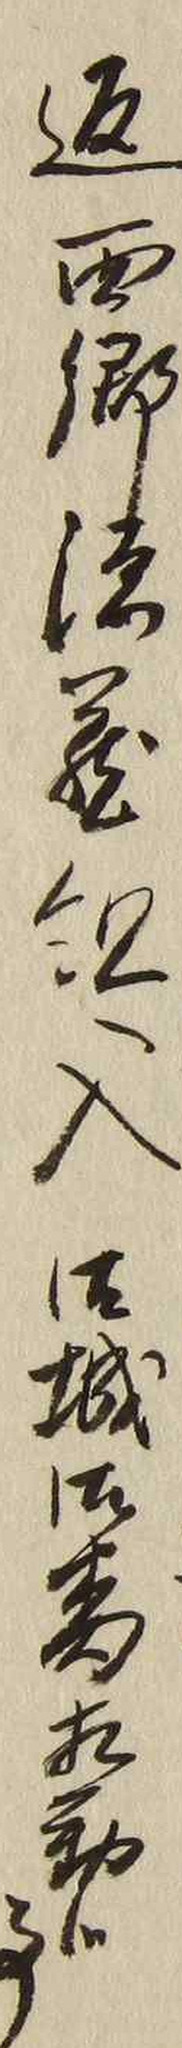返西郷源蔵組へ入御城御番相勤候事

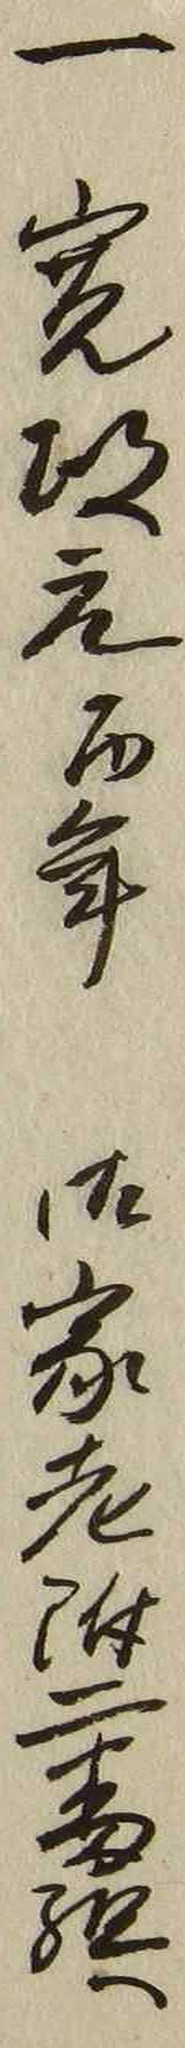一寛政元酉年御家老附二番組へ
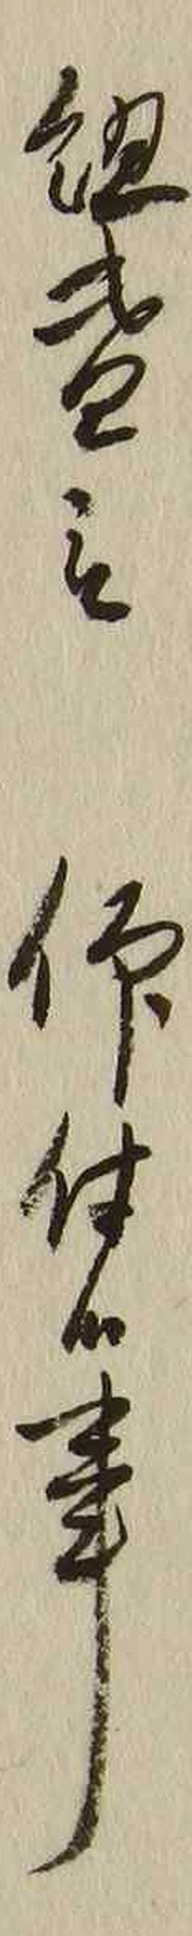組替被仰付候事
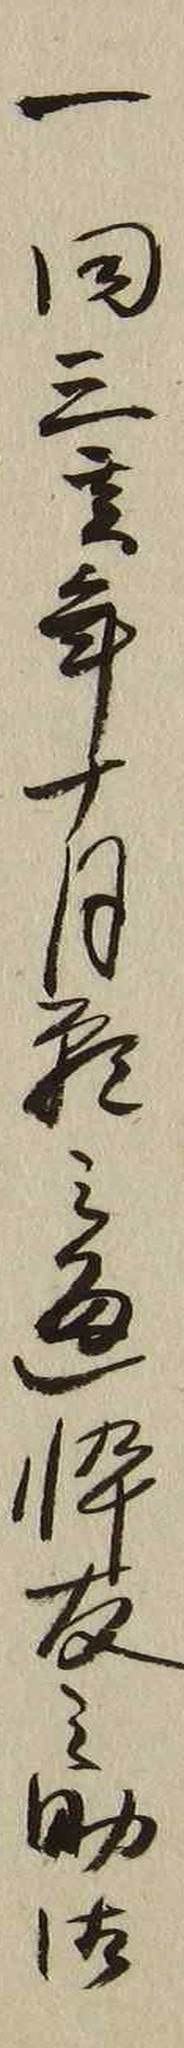一同三亥年十月願之通忰友之助御
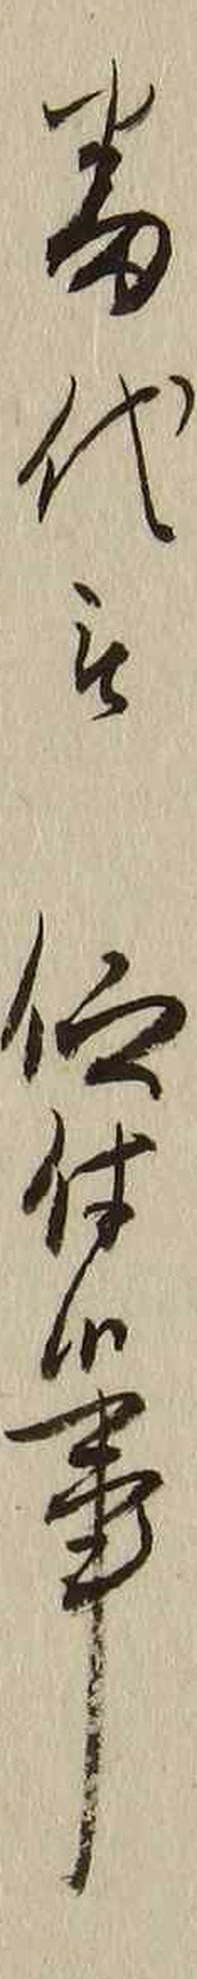番代被仰付候事
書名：諸士系譜　巻之346　も之部2
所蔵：会津若松市立会津図書館
